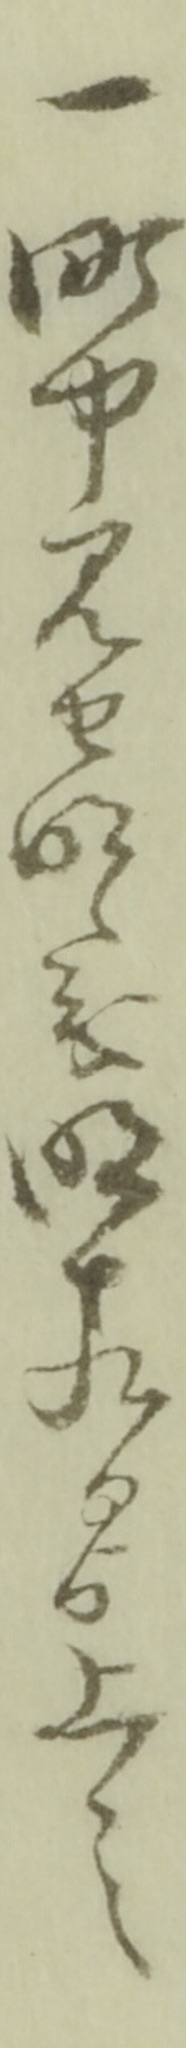一町中見セ明候義明十九日より上候之
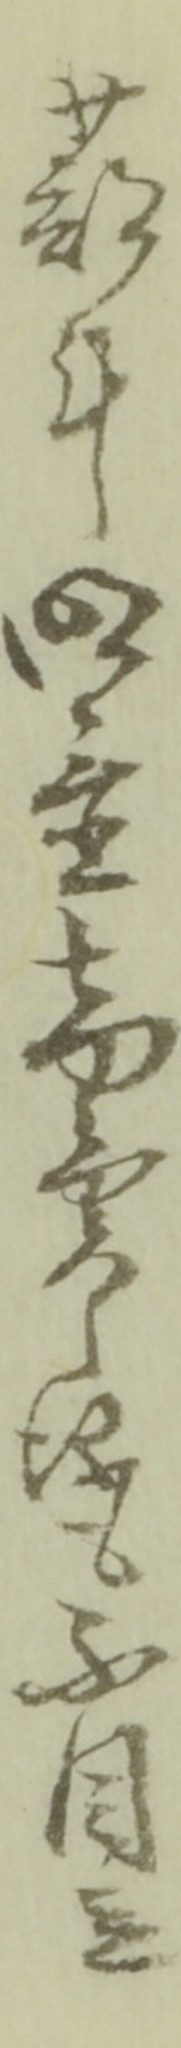藪計明置商売候儀も不目懸
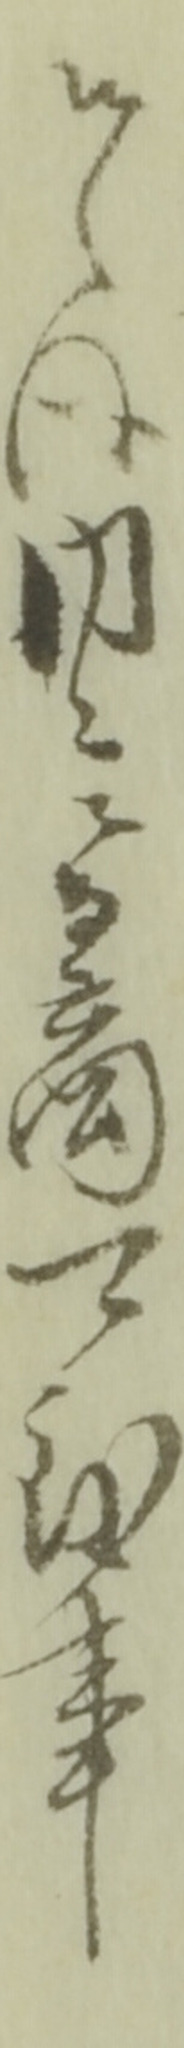え候様内々二而商可致事
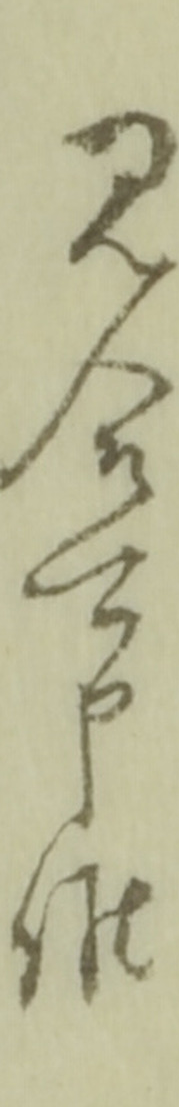見合可申候
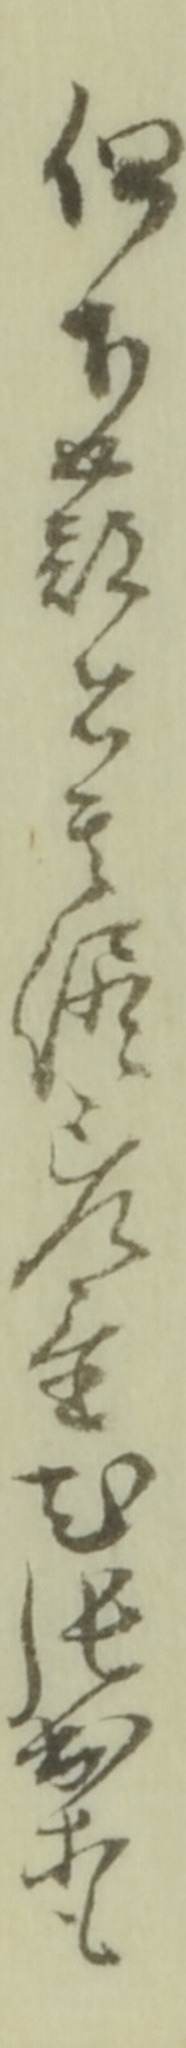但下藪者其の脇二差置尤張出等も
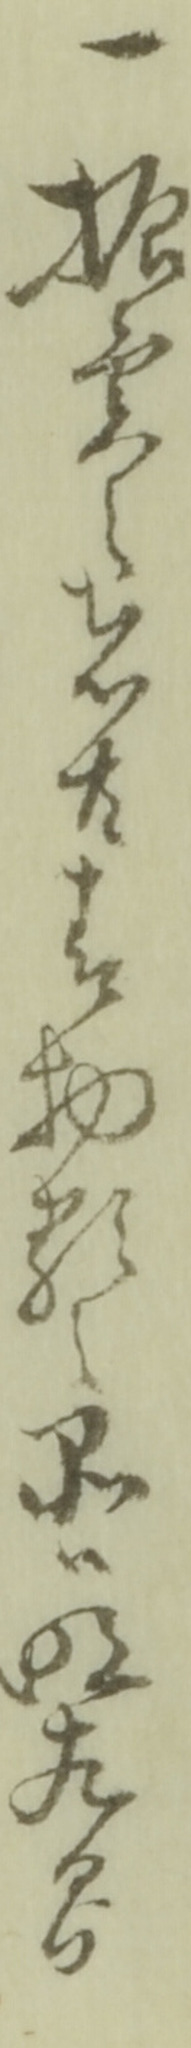一振売之者共春物類之品々明十九日より
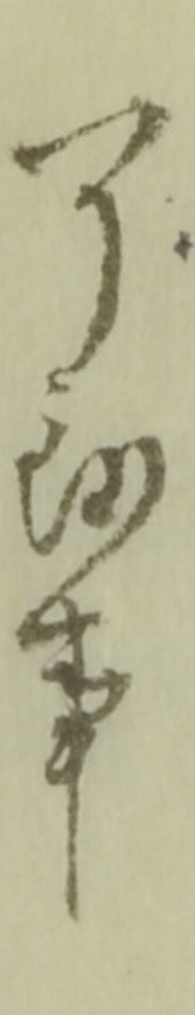可致事
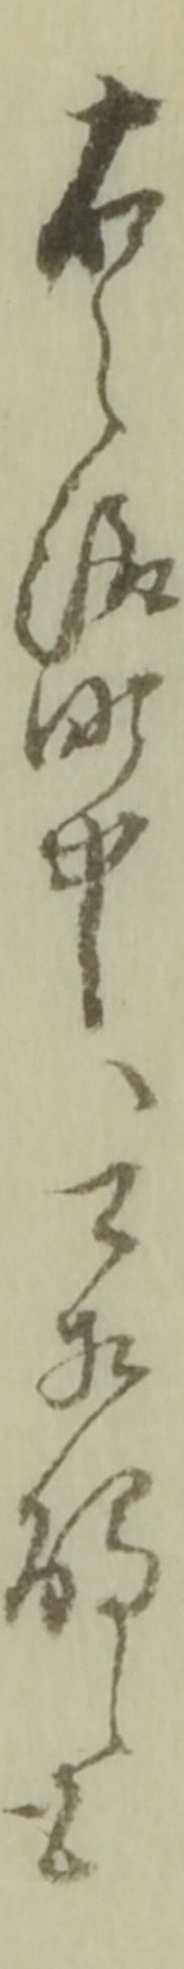右之趣町中へ可相触候以上
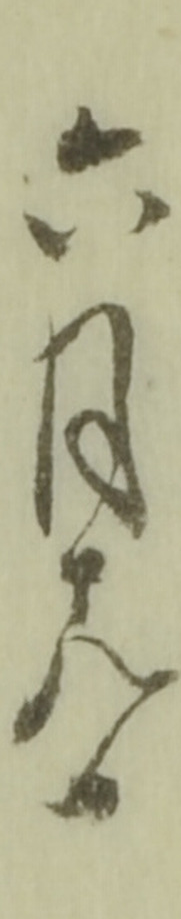六月十八日

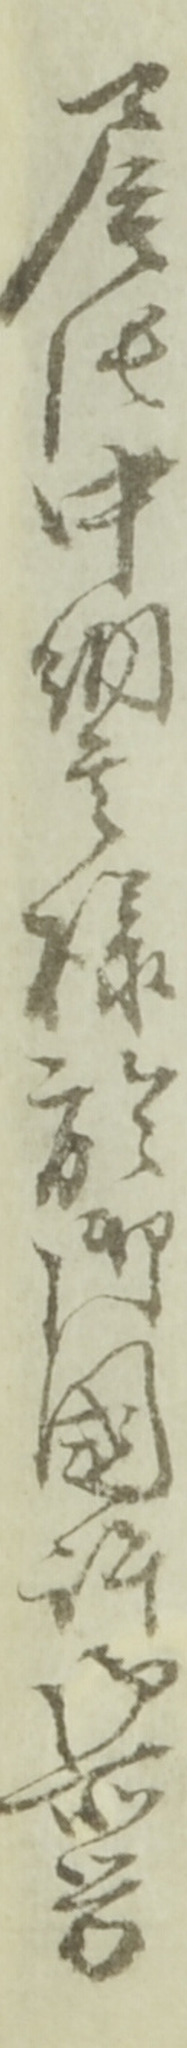尾張中納言様於御国許御所労
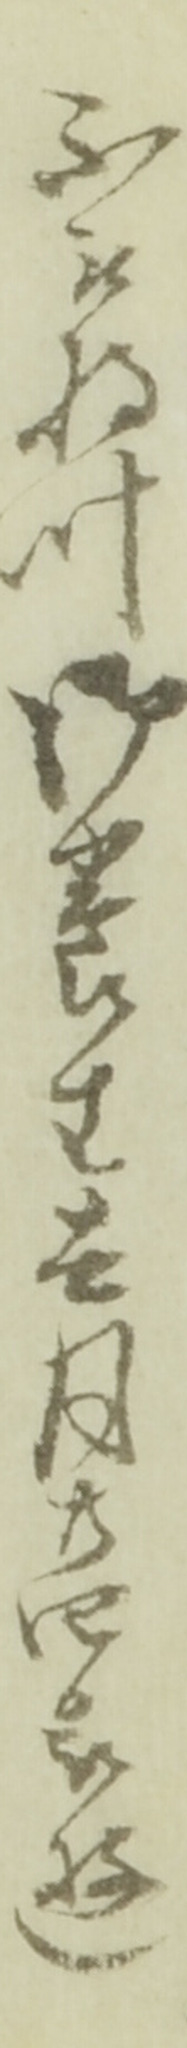不被持叶御養生去月廿四日被遊
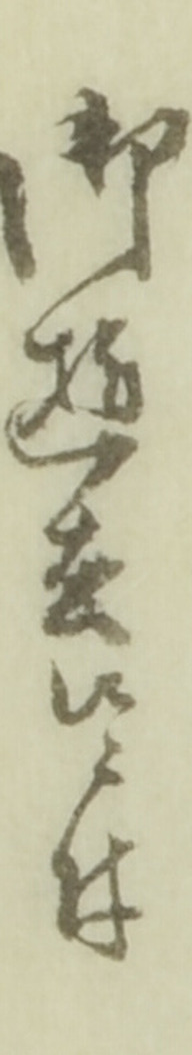御逝去候二付
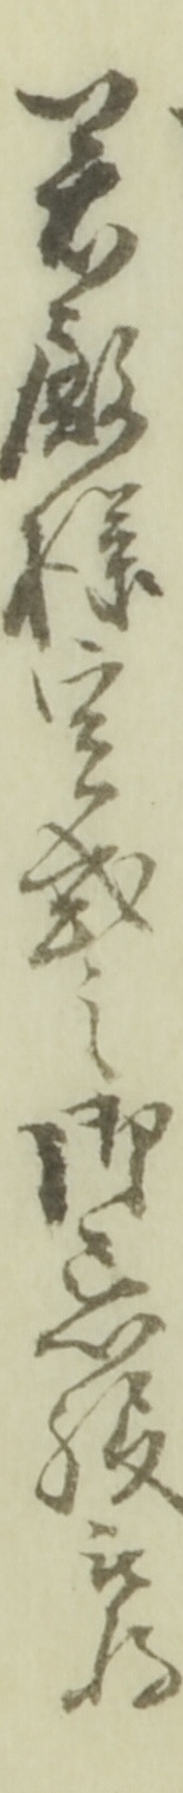若殿様定式之御忌服被為
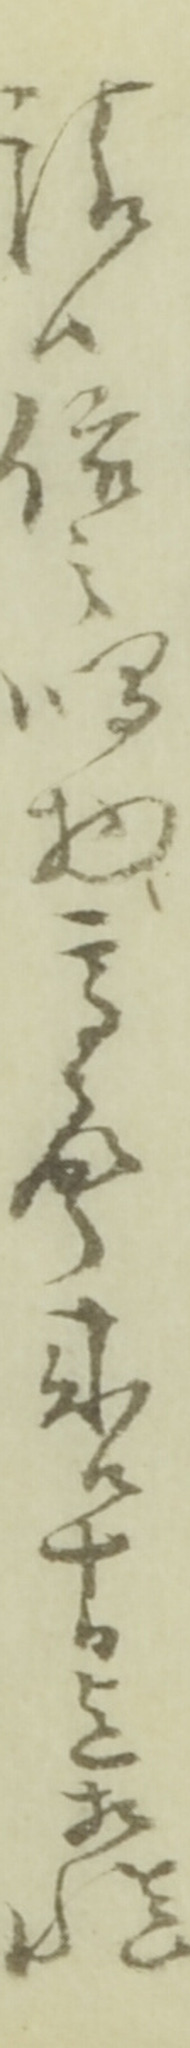請候依之鳴物高芸来候十日迄相慎
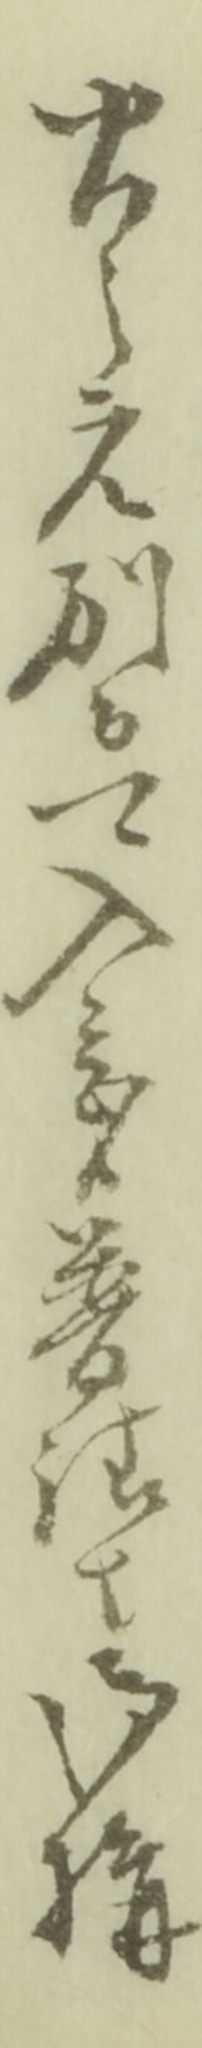火之許別而可入念候普請者御構
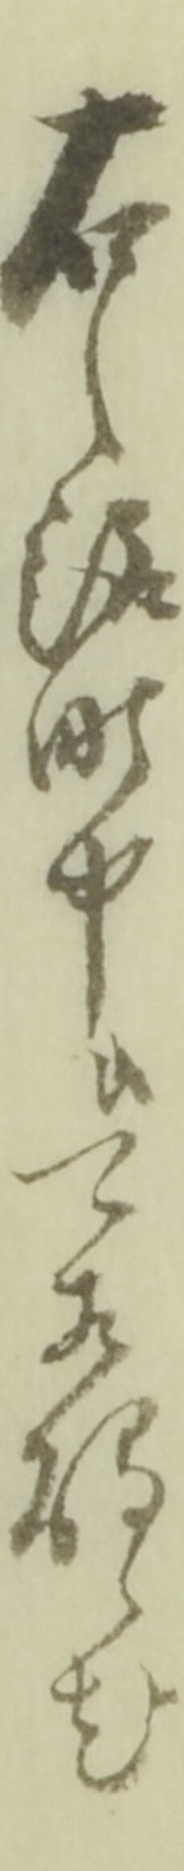右之趣町中え可相触候尤
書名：御公儀様御領主様御触書控
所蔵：伊那市立高遠町図書館・合同会社AMANE
